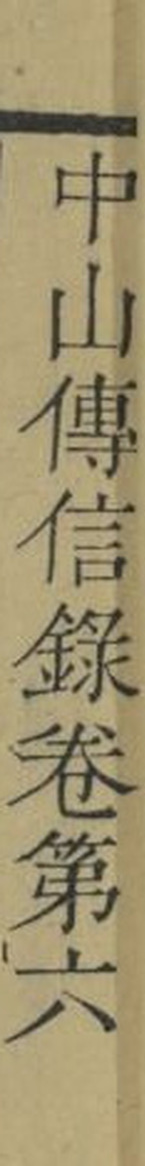中山伝信録巻第六

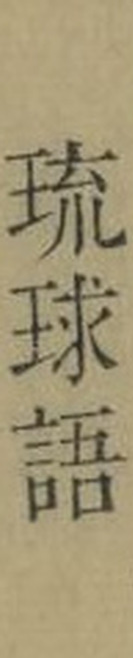琉球語
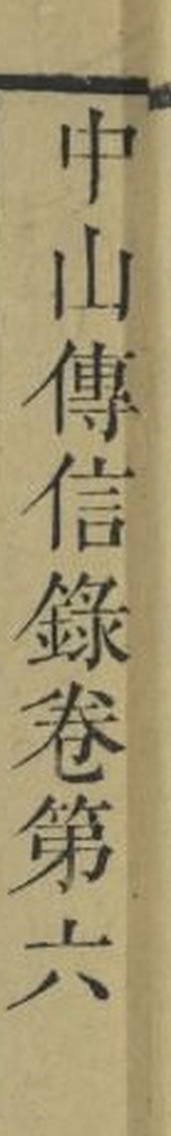中山伝信録巻第六
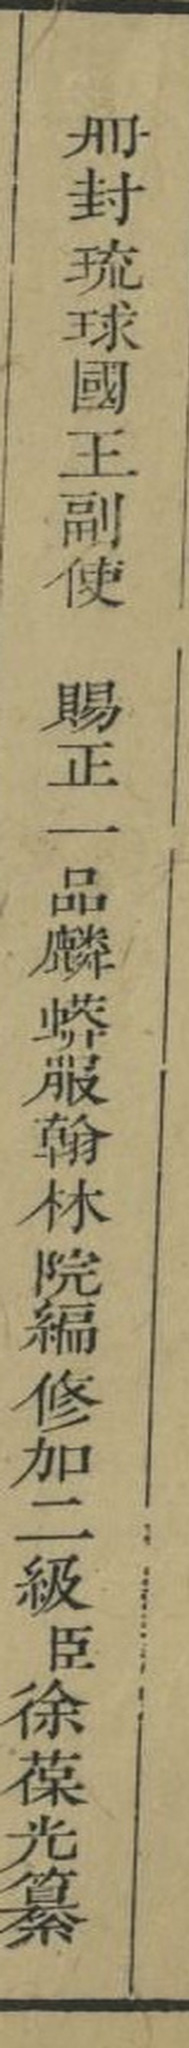冊封琉球国王副使賜正一品麟蟒服翰林院編修加二級臣徐葆光纂
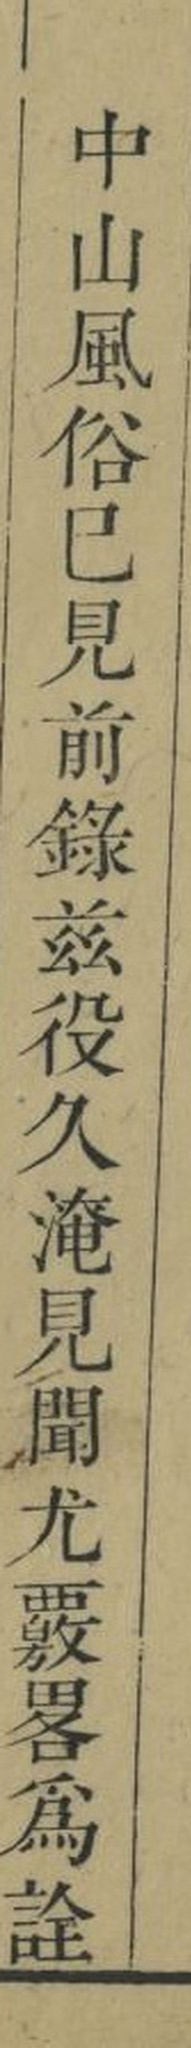中山風俗巳見前録茲役久淹見聞尤覈略為詮
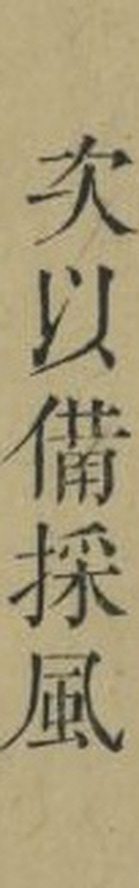次以備採風
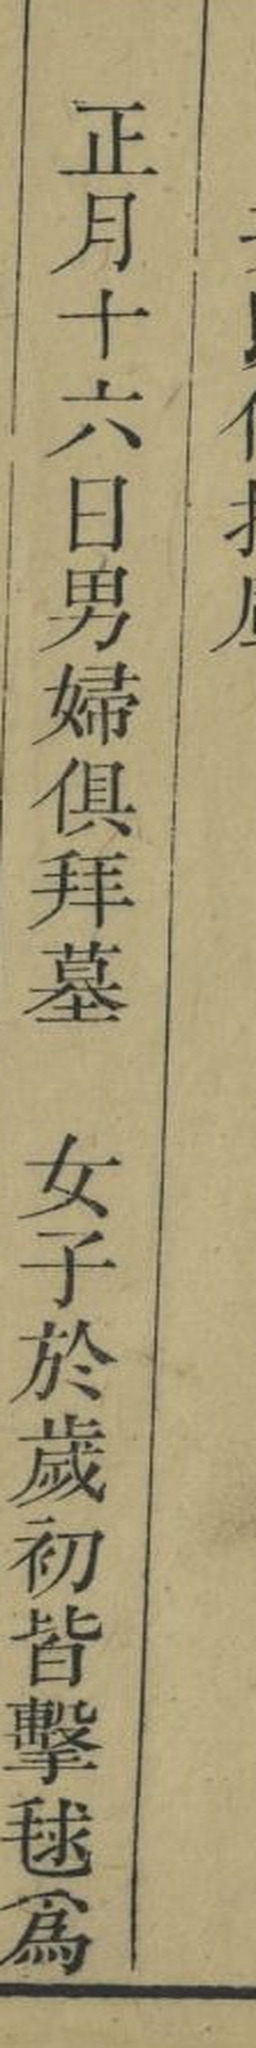正月十六日男婦倶拝墓女子於歳初皆撃毬為
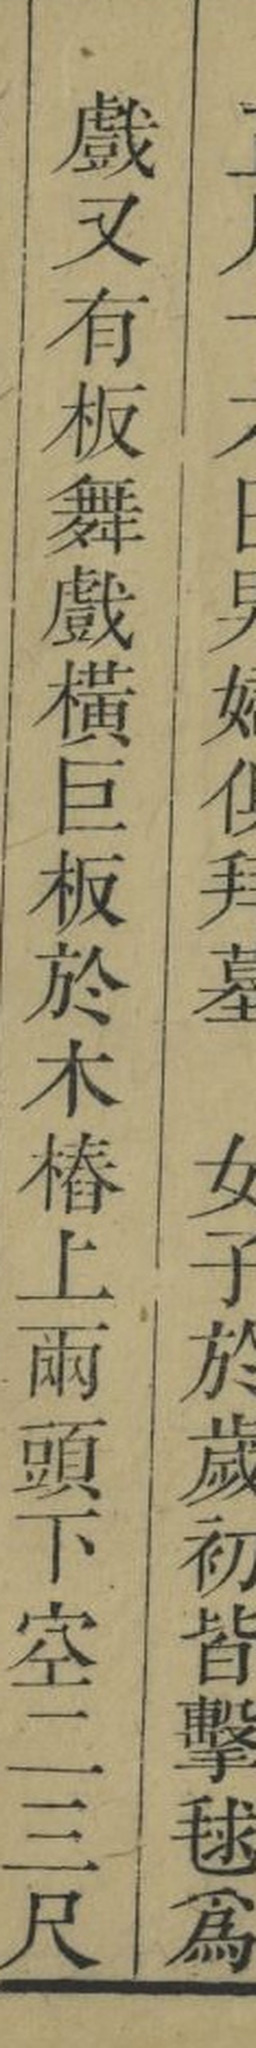戯又有板舞戯横巨板於木椿上両頭下空二三尺
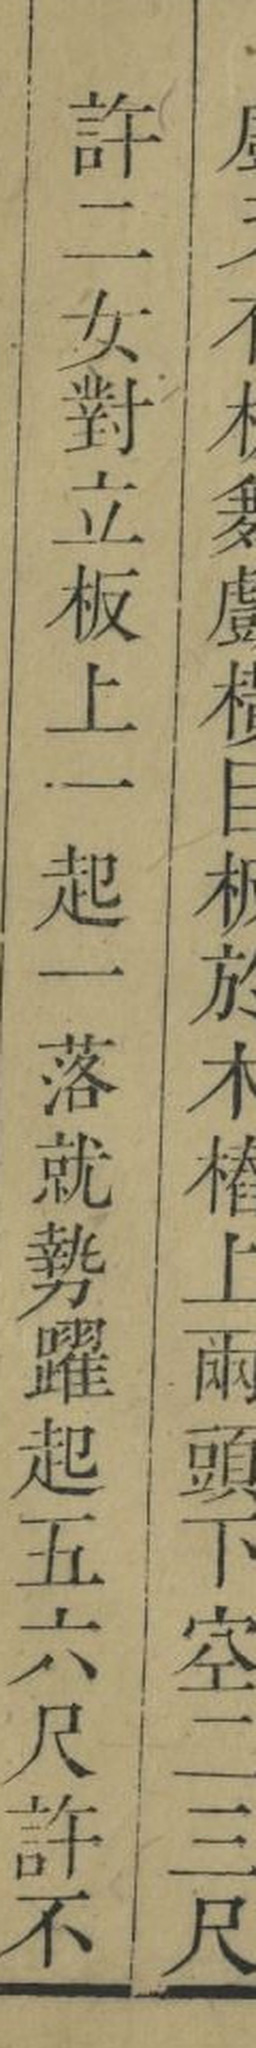許二女対立板上一起一落就勢躍起五六尺許不

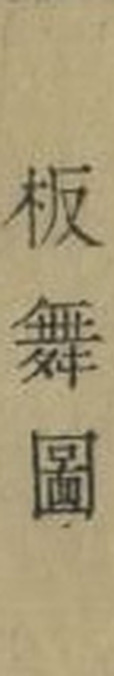板舞図
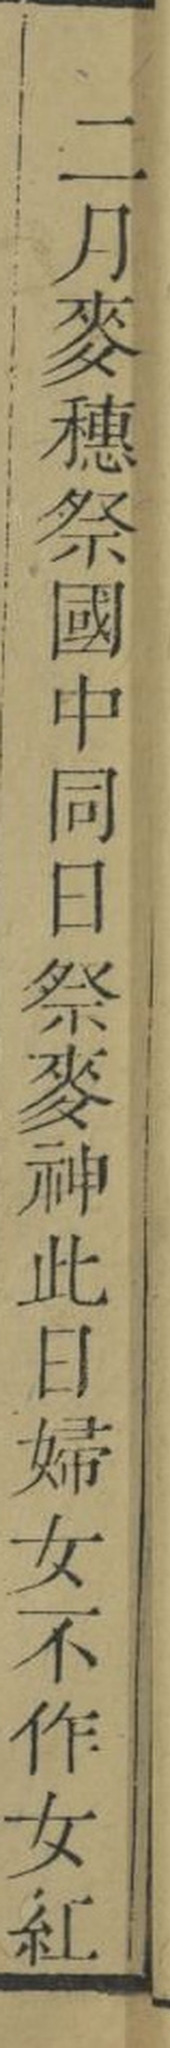二月麦穂祭国中同日祭麦神此日婦女不作女紅
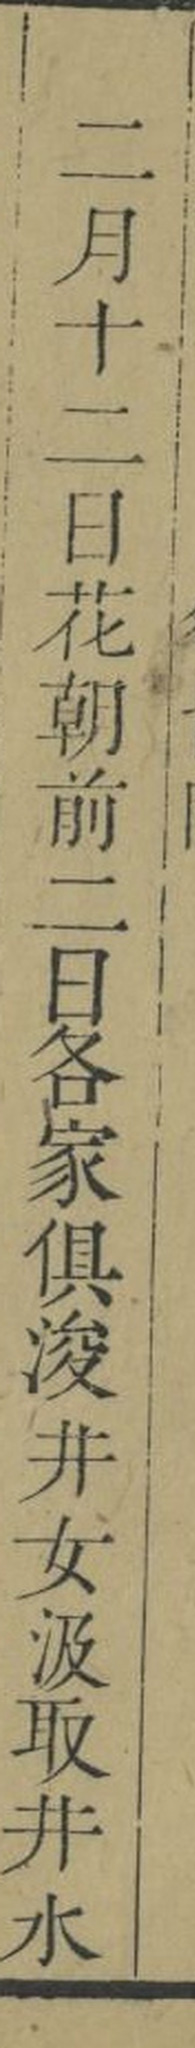二月十二日花朝前二日各家俱浚井女汲取井水
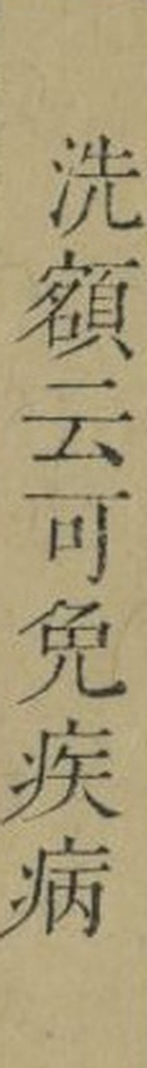洗額云可免疾病
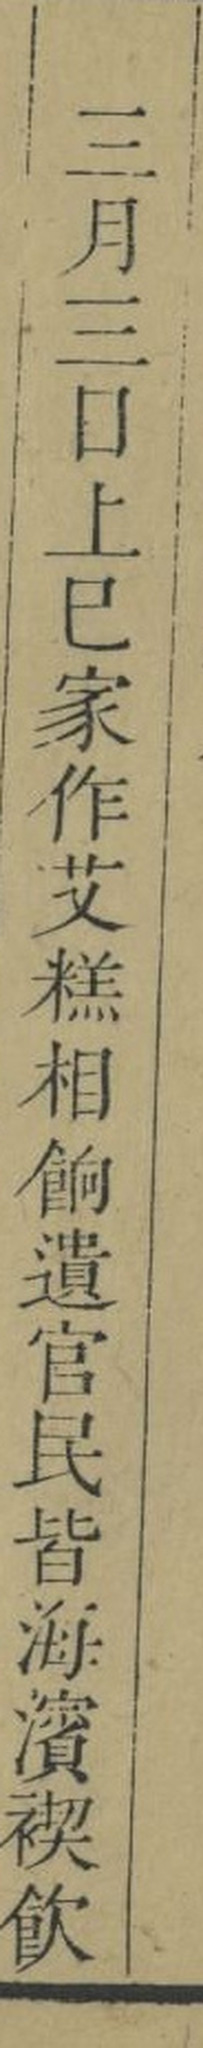三月三日上巳家作艾糕相餉遺官民皆海浜禊飲
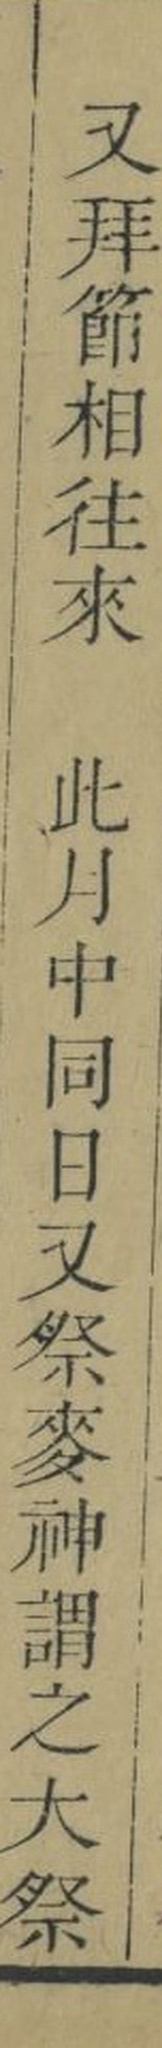又拝節相往来此月中同日又祭麦神謂之大祭
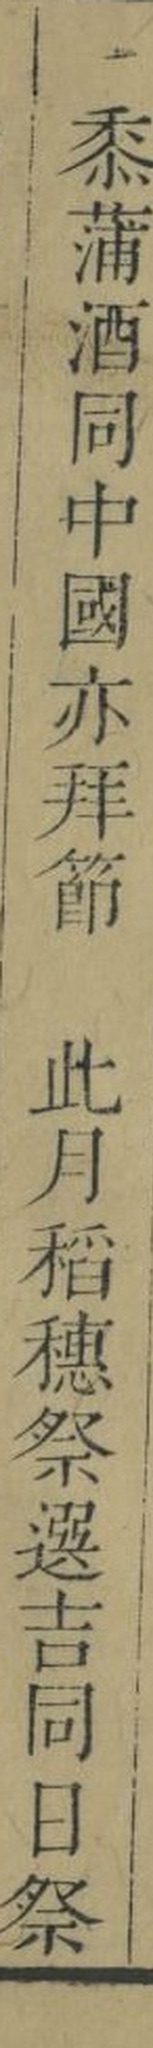黍蒲酒同中国亦拝節此月稲穂祭選吉同日祭
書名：中山伝信録 巻六
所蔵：University of the Ryukyus Library
